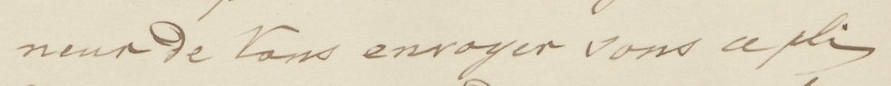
neur de Vous envoyer sous ce pli
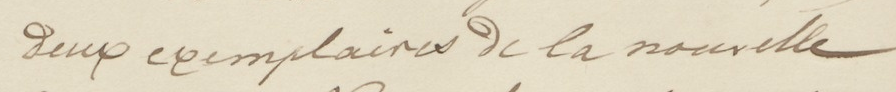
deux exemplaires de la nouvelle
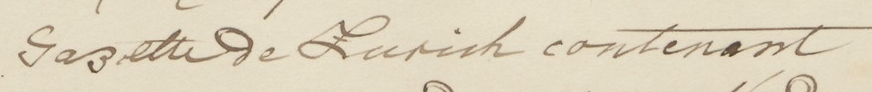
Gazette de Zurich contenant
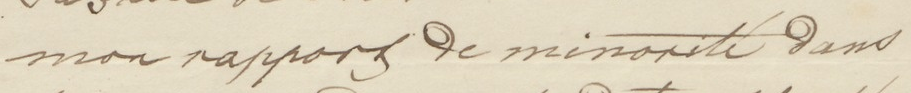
mon rapport de minorité dans
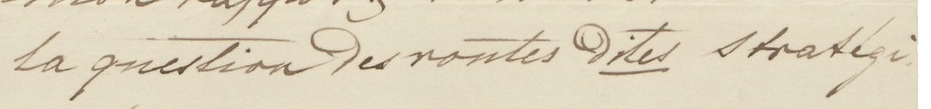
la question des routes dites stratégi-
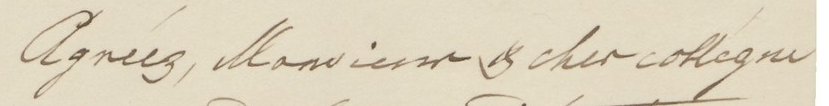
Agréez, Monsieur & cher collegue
